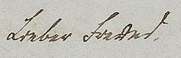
Lieber Freund.
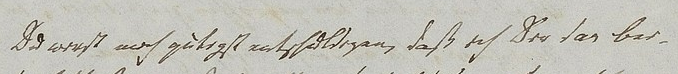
Du wirst mich gütigst entschuldigen, daß ich Dir das bei-
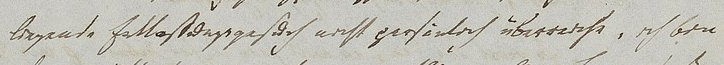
liegende Entlassungsgesuch nicht persönlich überreiche, ich bin
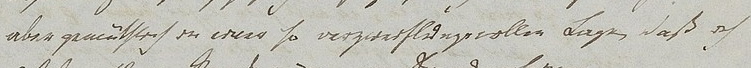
aber gemüthlich in einer so verzweiflungsvollen Lage, daß ich
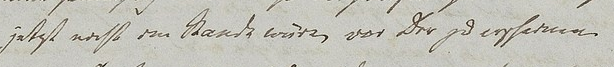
jetzt nicht im Stande wäre, vor Dir zu erscheinen.
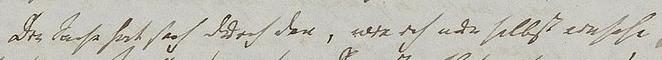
Die Sache hat sich durch den, wie ich nun selbst einsehe,
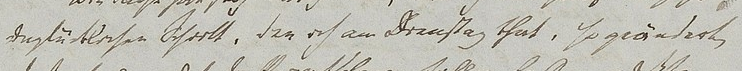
unglücklichen Schritt, den ich am Dienstag that, so geändert,
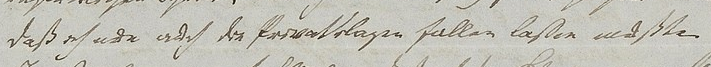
daß ich nun auch die Privatklagen fallen lassen mußte.
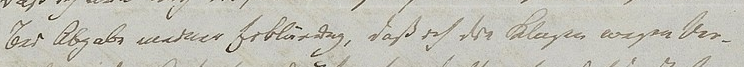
Bei Abgabe meiner Erklärung, daß ich die Klagen wegen Ver-
